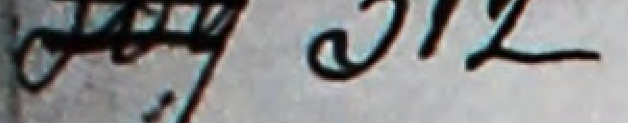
309 312
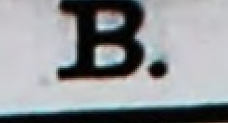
B.
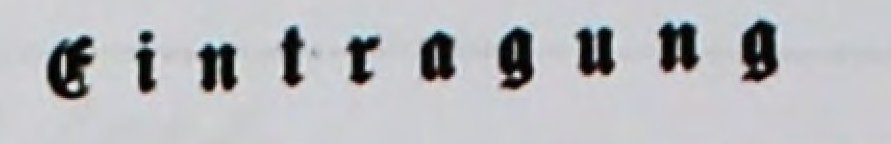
Eintragung
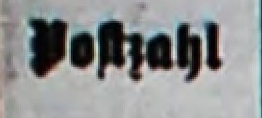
Postzahl
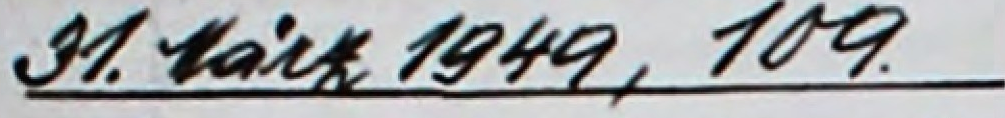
31. März 1949, 109.
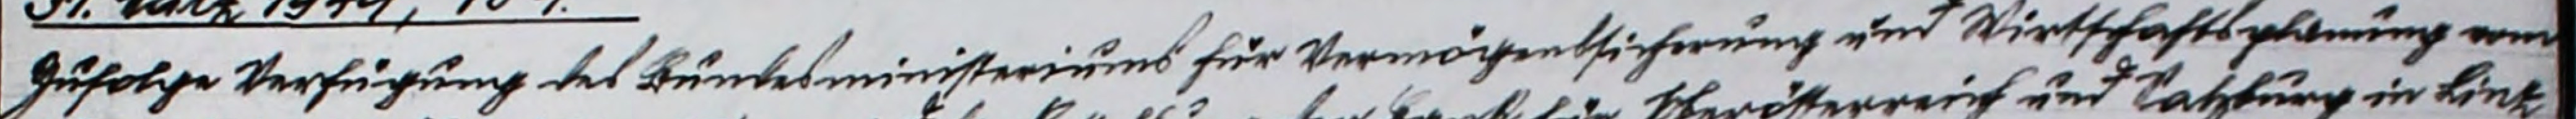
Gufohge Verfügung des Bundesministeriums für Vermögenssicherung und Wirtschaftsplanung vom
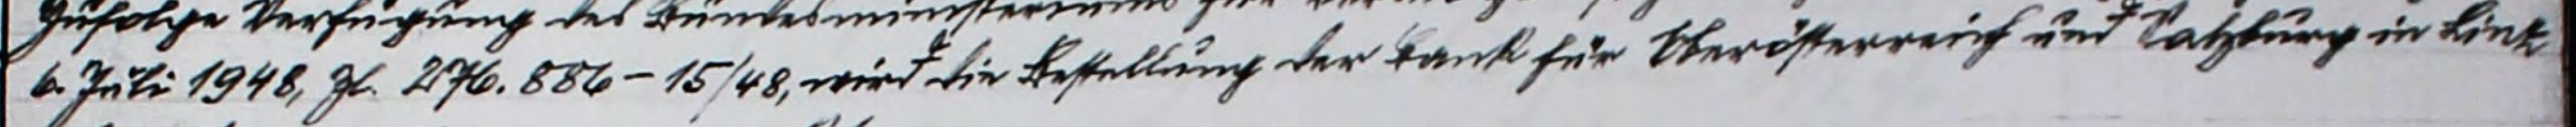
6. Juli 1948, Zl. 276. 886 - 15/48, wird die Bestellung der Bank für Oberösterreich und Salzburg in Linz
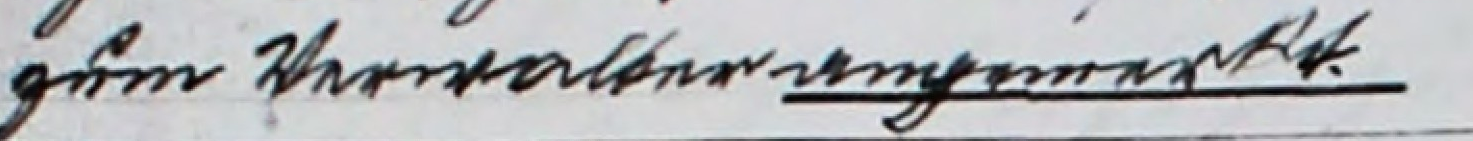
zum Verwalter angemerkt.
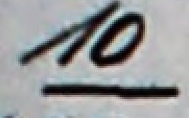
10
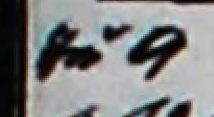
zu 9
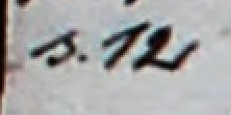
s. 12
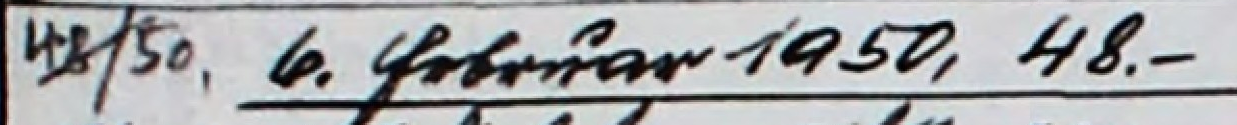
48/50, 6. Februar 1950, 48. -
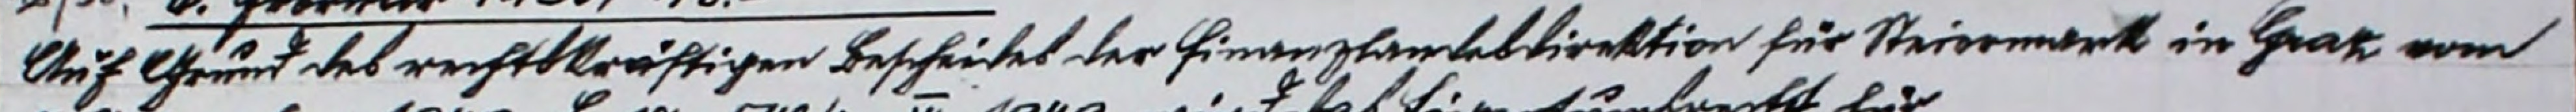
Auf Grund des rechtskräftigen Bescheides der Finanzlandesdirektion für Steiermark in Graz vom
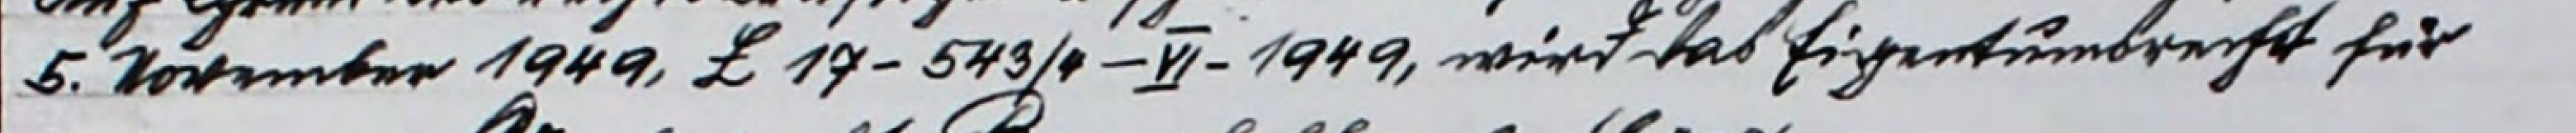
5. November 1949, L 17 - 543/4 - VI - 1949, wird das Eigentumsbrecht für
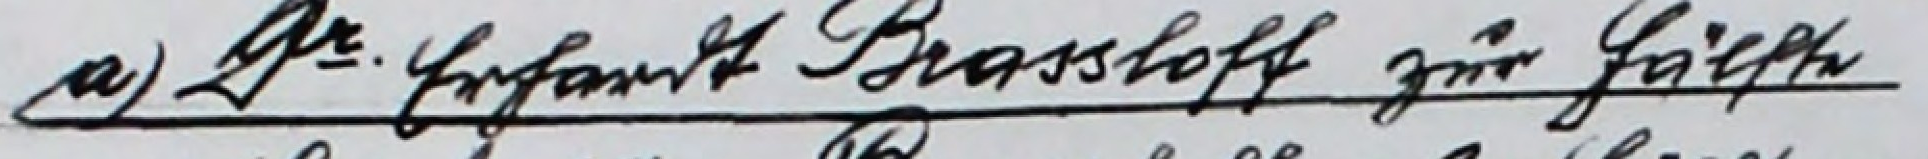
a) Dr. Erhardt Brassloff zur Hälfte
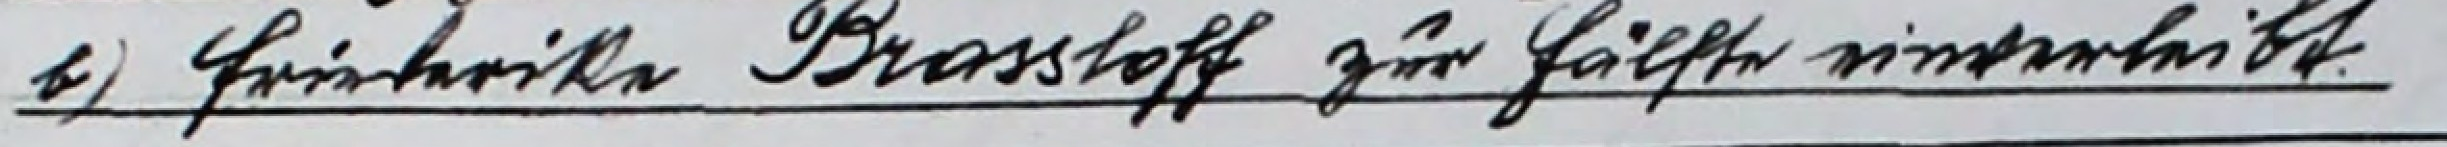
b) Friederike Brassloff zur Hälfte einverleibt.
